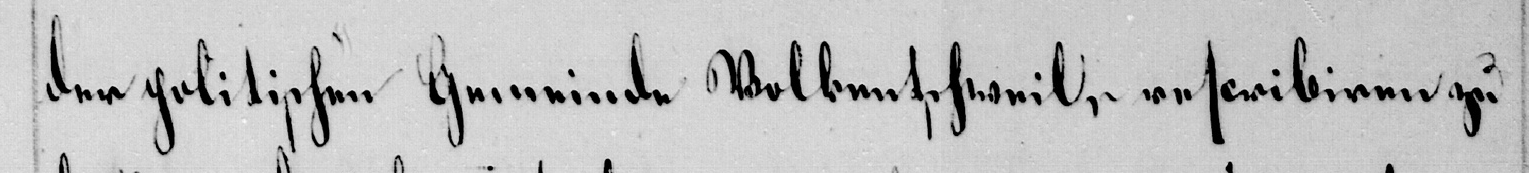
der politischen Gemeinde Volkentschweil rescribiren zu
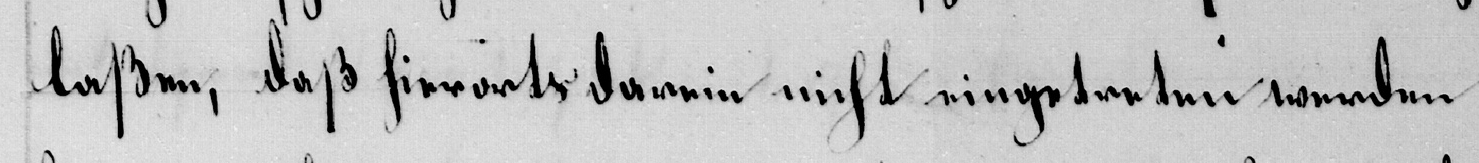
laßen, daß hierorts darin nicht eingetreten werden
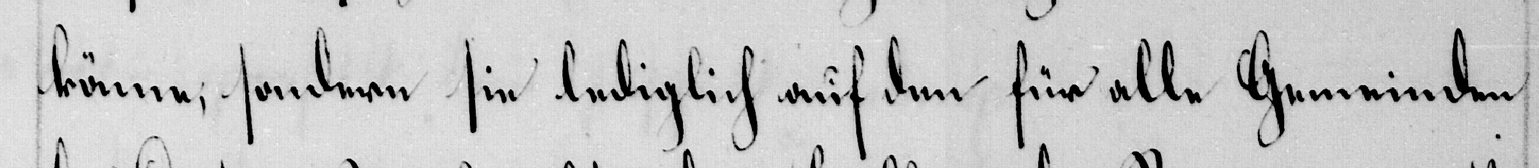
könne; sondern sie lediglich auf den für alle Gemeinden
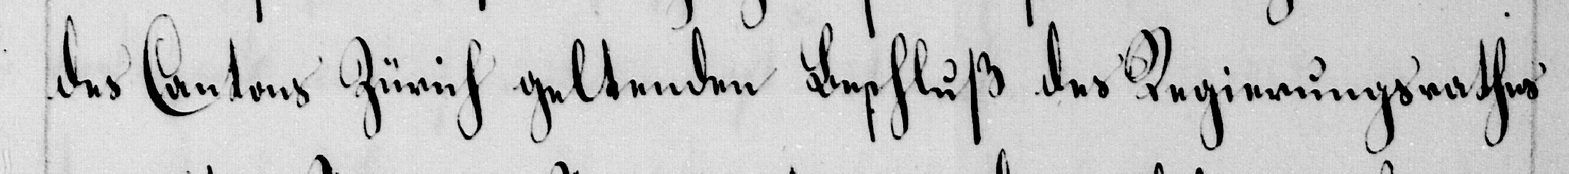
des Cantons Zürich geltenden Beschluß des Regierungsrathes
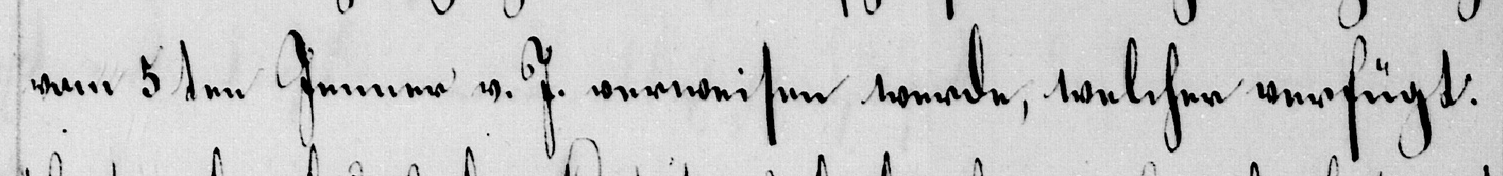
vom 5ten Januar v. J. verweisen werde, welcher verfügt:
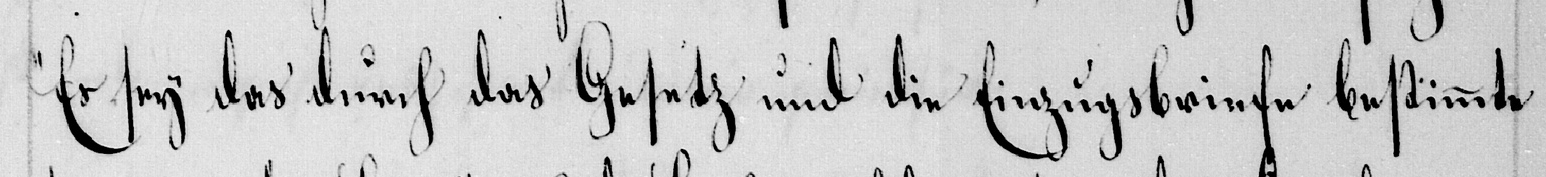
„Es sey das durch das Gesetz und die Einzugsbriefe bestimmte
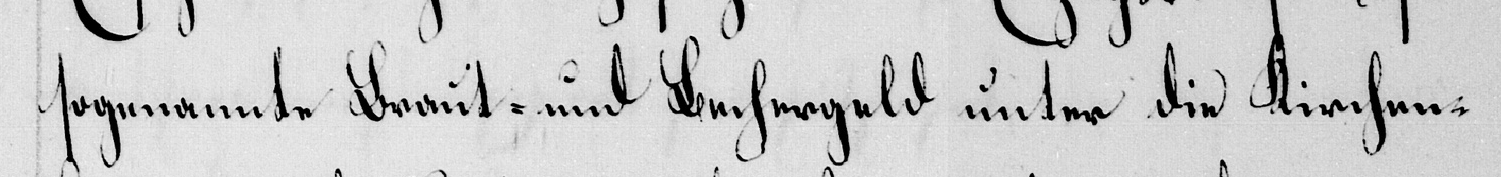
sogenannte Braut- und Bechergeld unter die Kirchen-
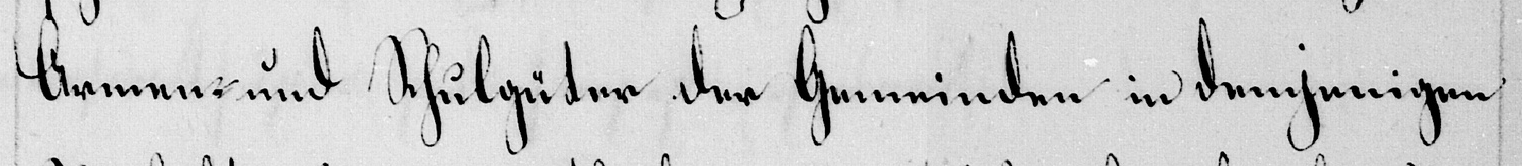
Armen- und Schulgüter der Gemeinden in demjenigen
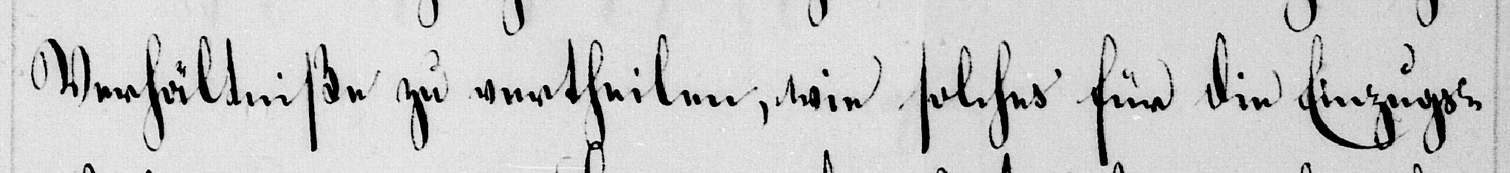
Verhältniße zu vertheilen, wie solches für die Einzugs¬
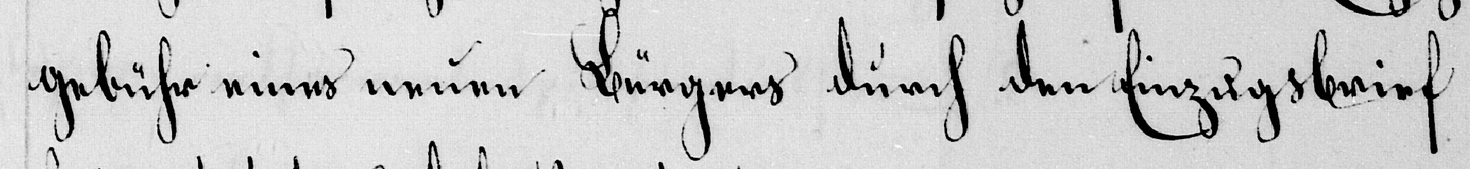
gebühr eines neuen Bürgers durch den Einzugsbrief
